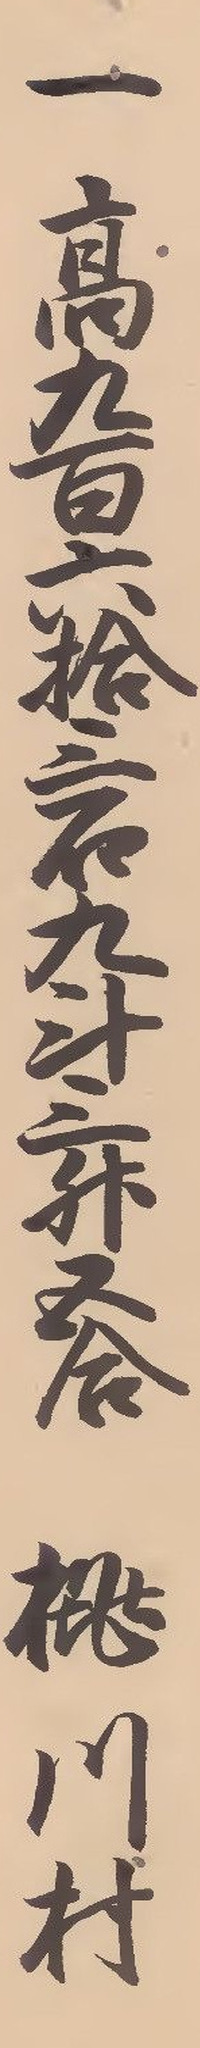一高九百六拾三石九斗三升五合桃川村
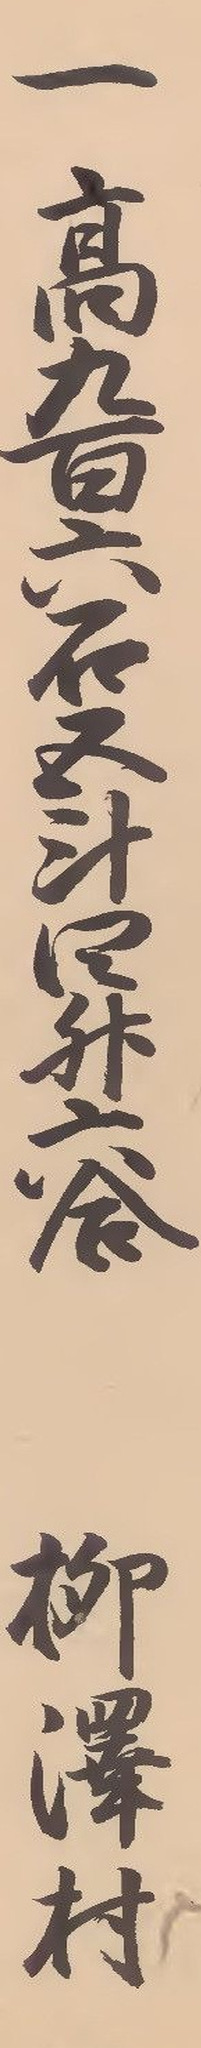一高九百六石五斗四升六合柳沢村
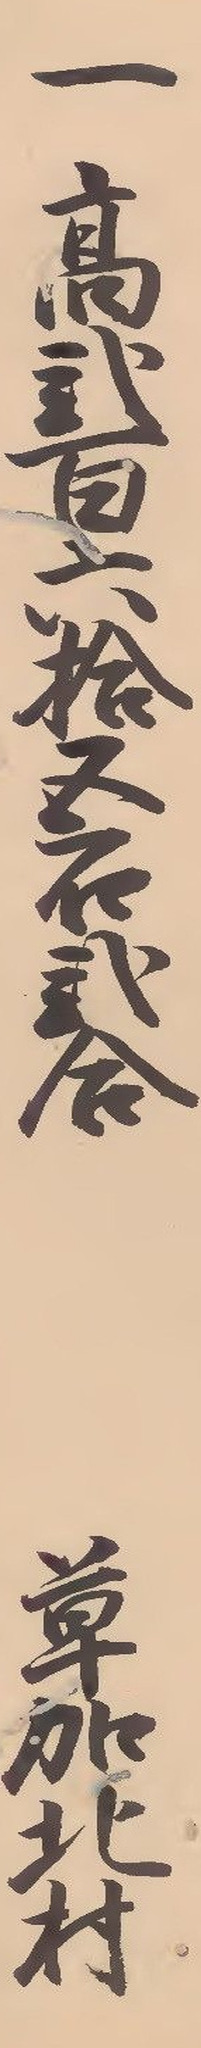一高弐百六拾五石弐合草加北村
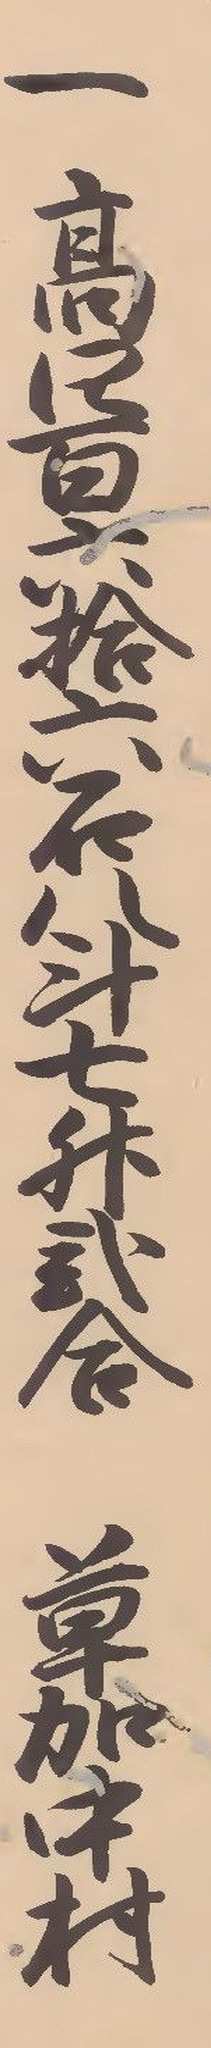一高四百六拾六石八斗七升弐合草加中村
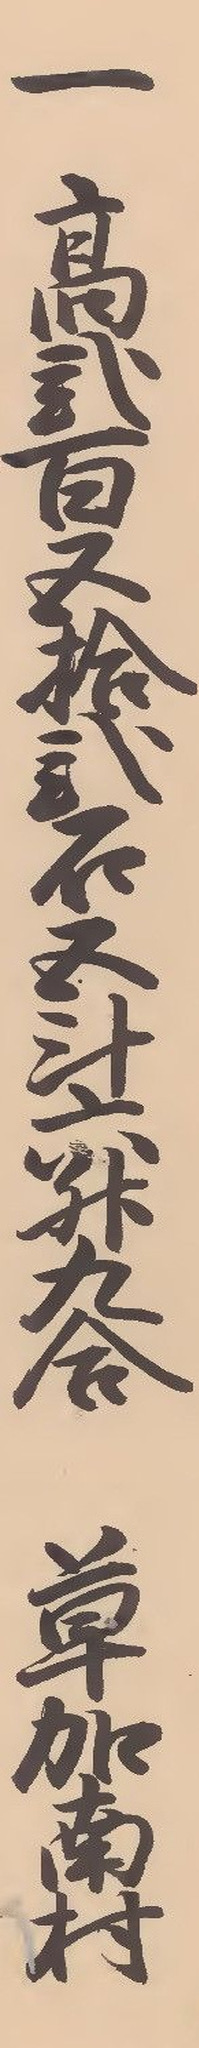一高弐百五拾弐石五斗六升九合草加南村
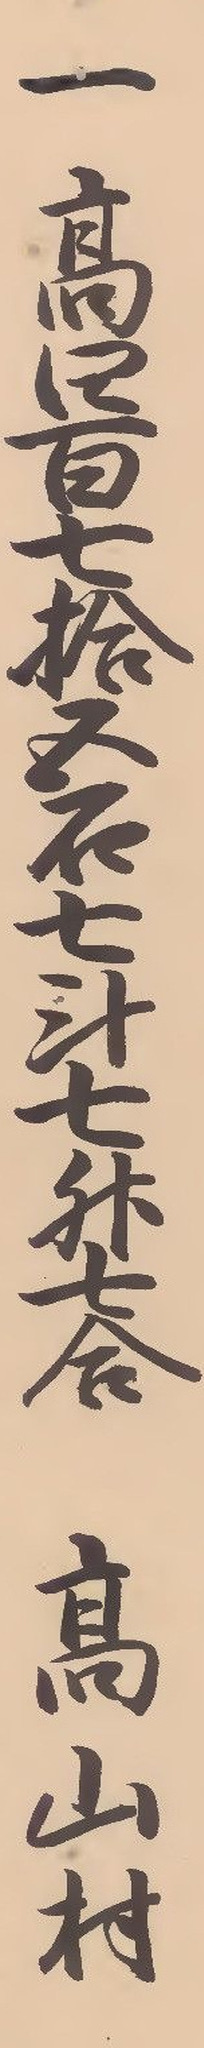一高四百七拾五石七斗七升七合高山村
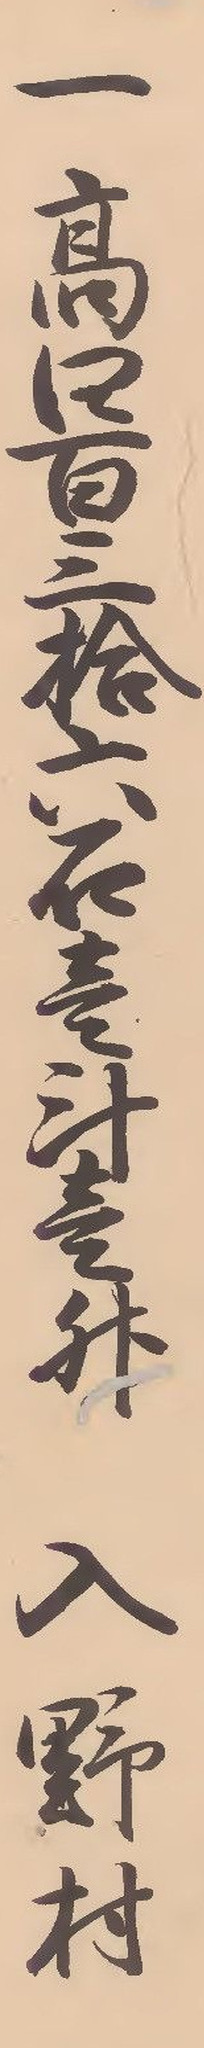一高四百三拾六石壱斗壱升入野村

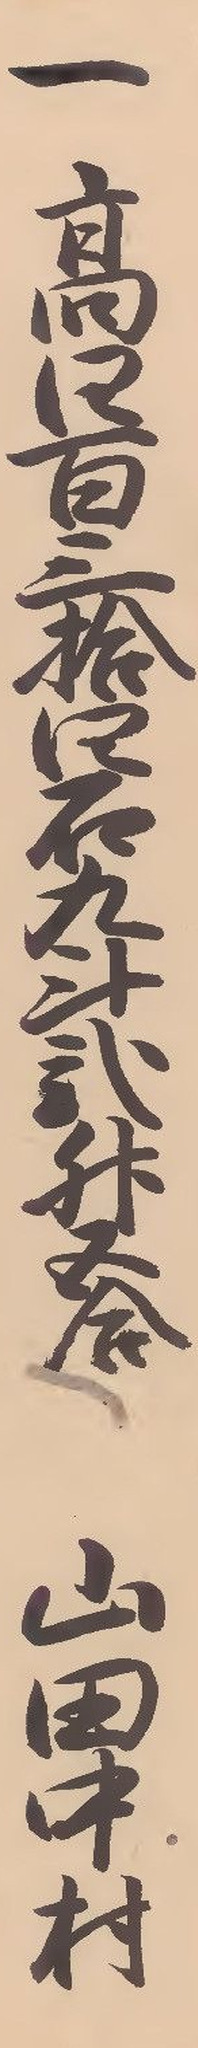一高四百三拾四石九斗弐升五合山田中村
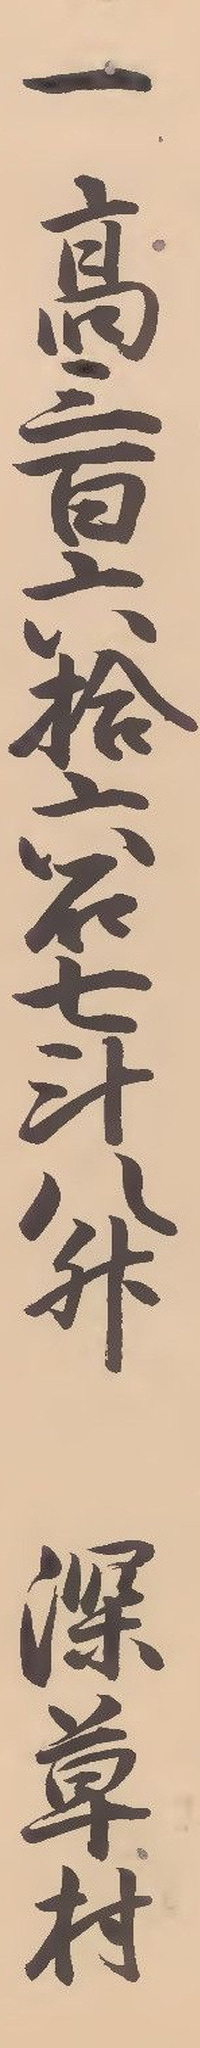一高三百六拾六石七斗八升深草村
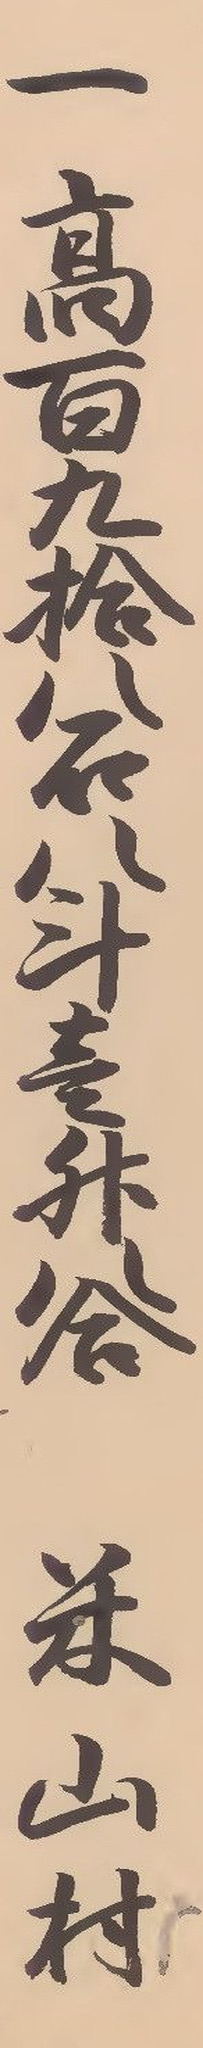一高百九拾八石八斗壱升八合米山村
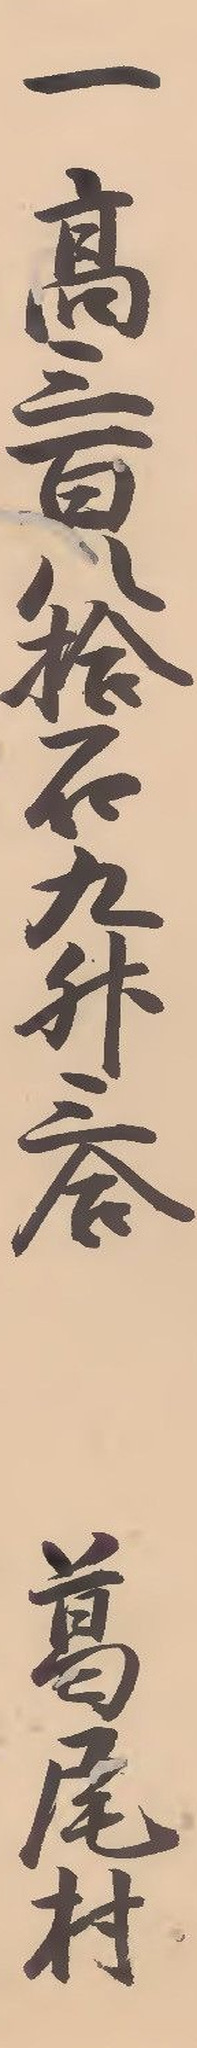一高三百八拾石九升三合葛尾村
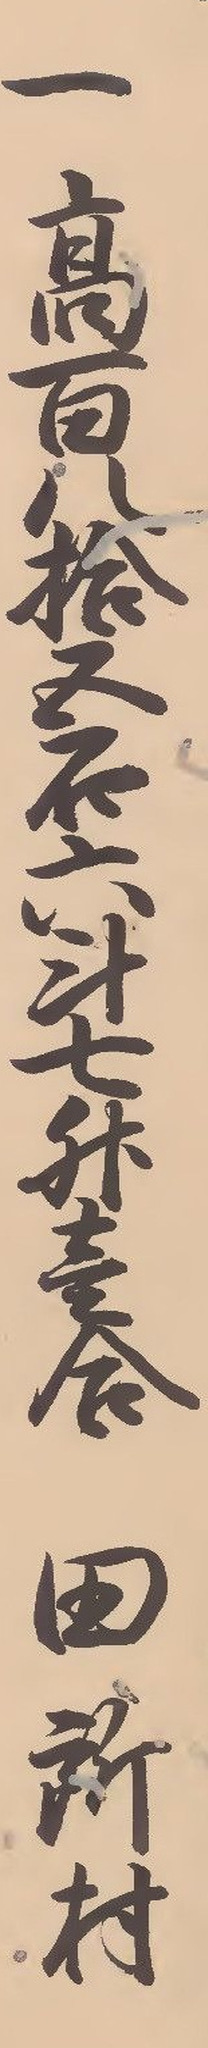一高百八拾五石六斗七升壱合田所村
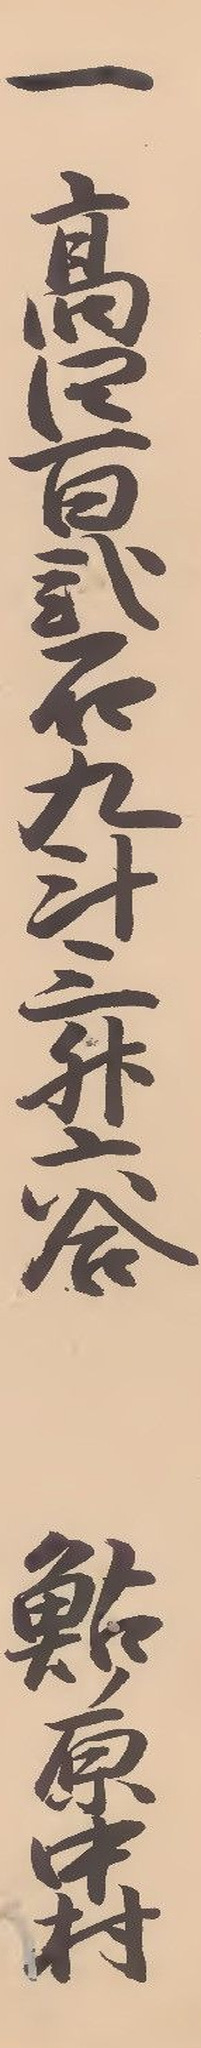一高四百弐石九斗三升六合鮎ノ原中村

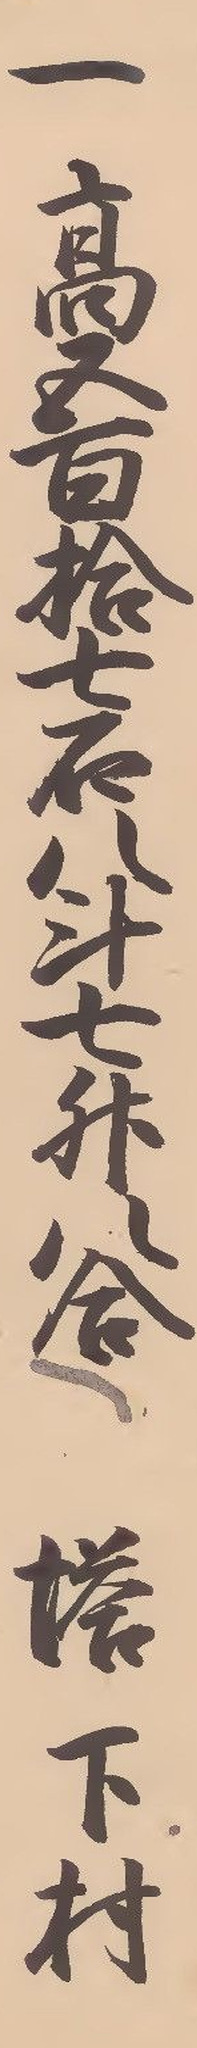一高五百拾七石八斗七升八合塔下村
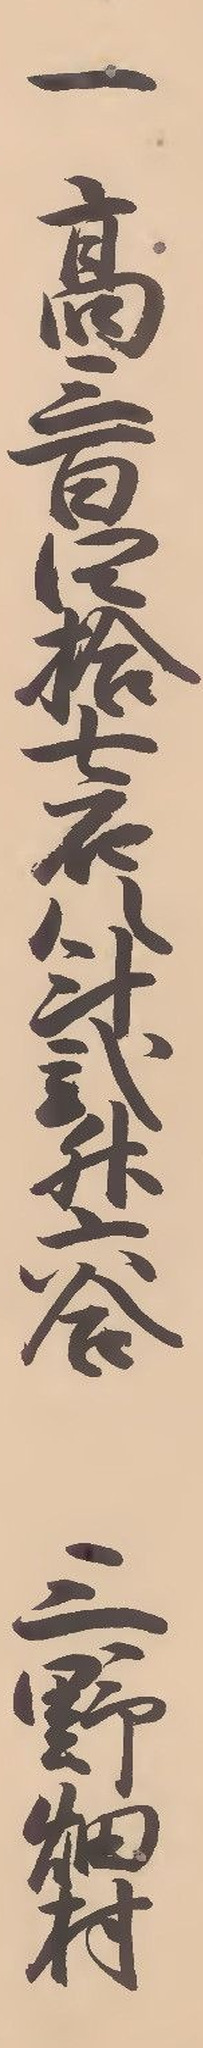一高三百四拾七石八斗弐升六合三野畑村
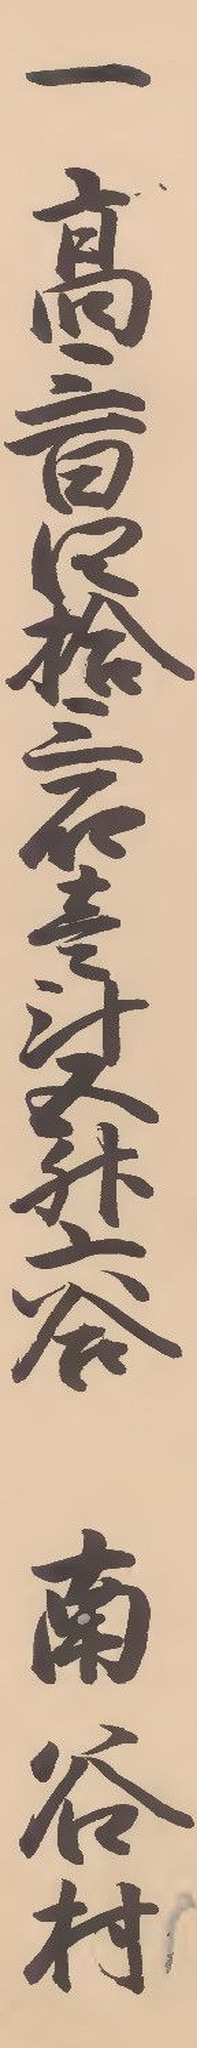一高三百四拾三石壱斗五升六合南谷村
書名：淡路国郷帳
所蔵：国立公文書館 National Archives of Japan
